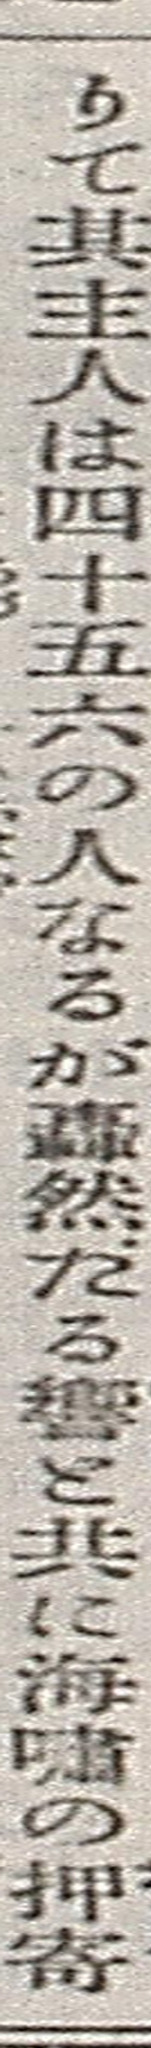りて其主人は四十五六の人なるが轟然たる響と共に海嘯の押寄
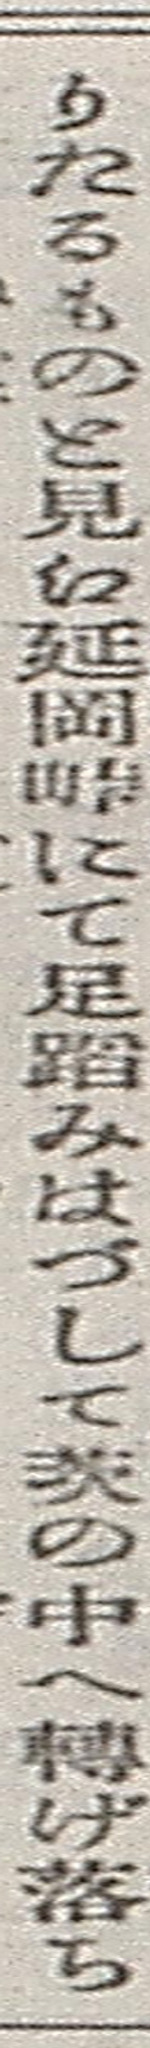りたるものと見え延岡峠にて足踏みはづして茨の中へ転げ落ち
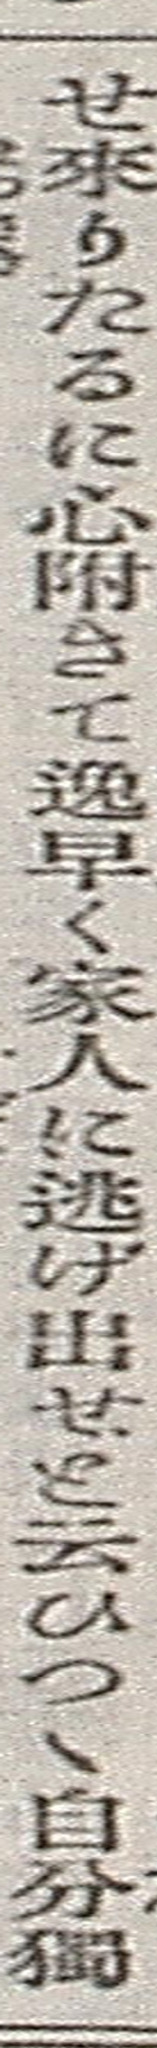せ来りたるに心付きて逸早く家人に逃げ出せと云ひつゝ自分独
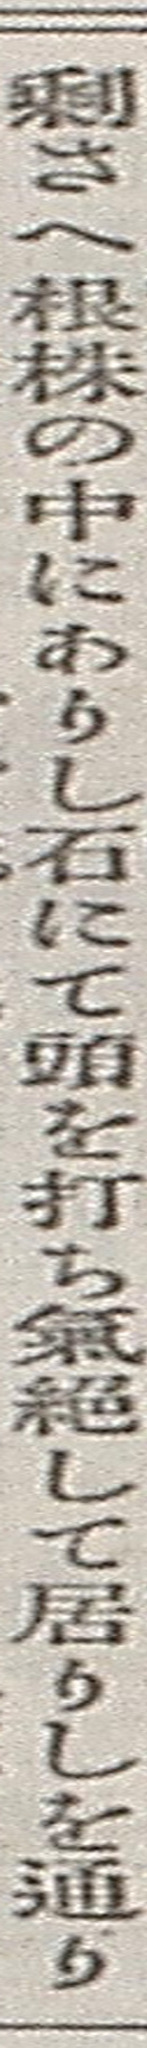剰さへ根株の中にありし石にて頭を打ち気絶して居りしを通り
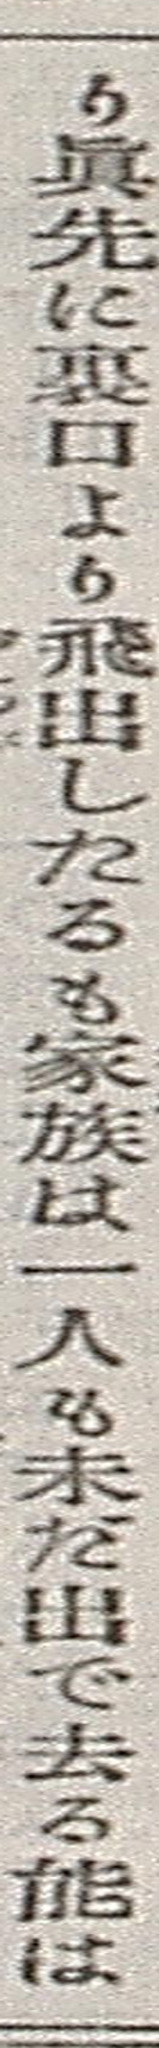り真先に裏口より飛出したるも家族は一人も未だ出で去る能は
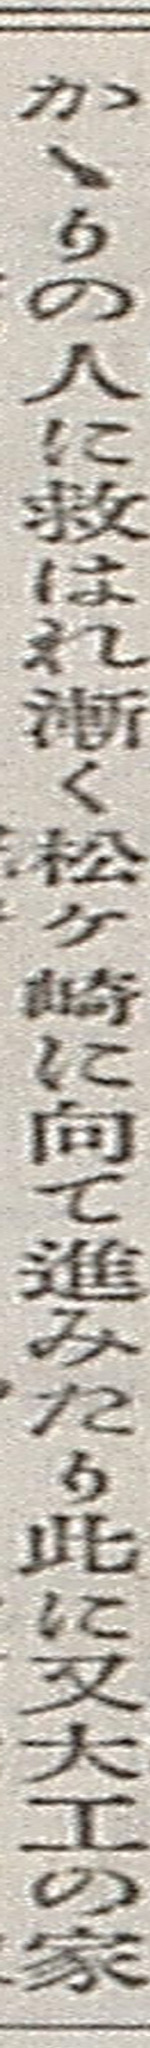かゝりの人に救はれ漸く松ヶ崎に向て進みたり此に又大工の家
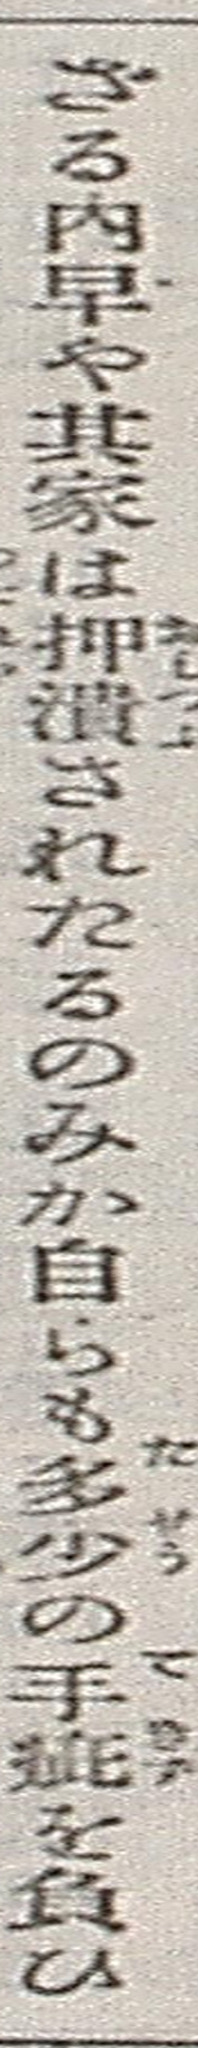ざる内早や其家は押潰されたるのみか自らも多少の手疵を負ひ
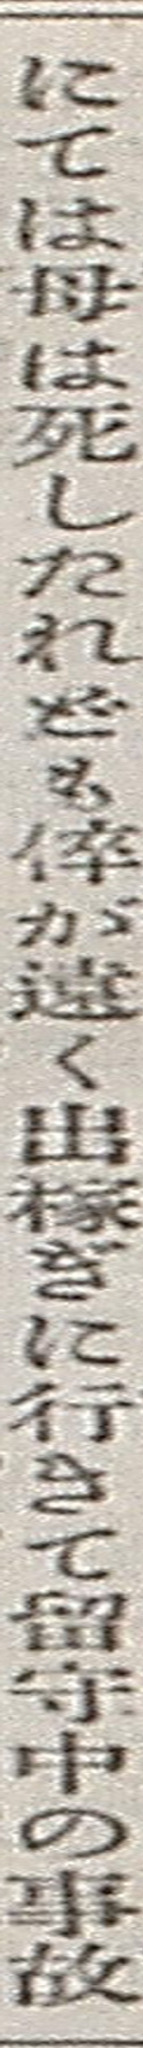にては母は死したれども悴が遠く出稼ぎに行きて留守中の事故
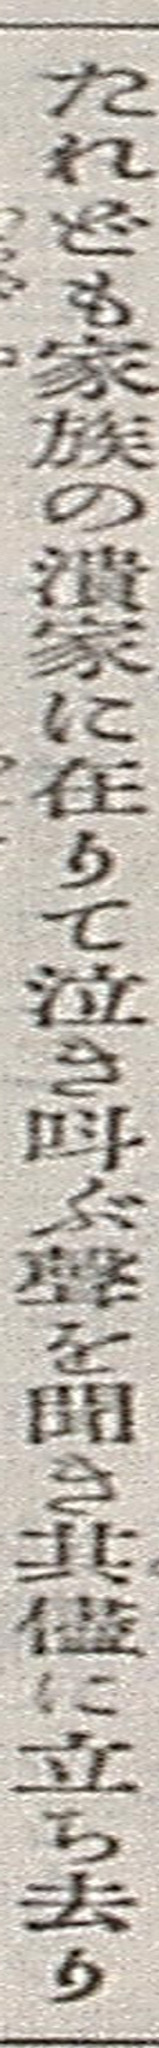たれども家族の潰家に在りて泣き叫ぶ声を聞き其侭に立ち去り
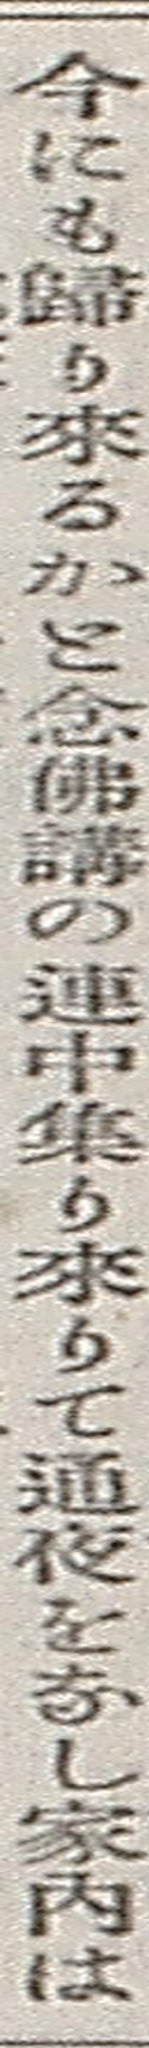今にも帰り来るかと念佛講の連中集り来りて通夜をなし家内は
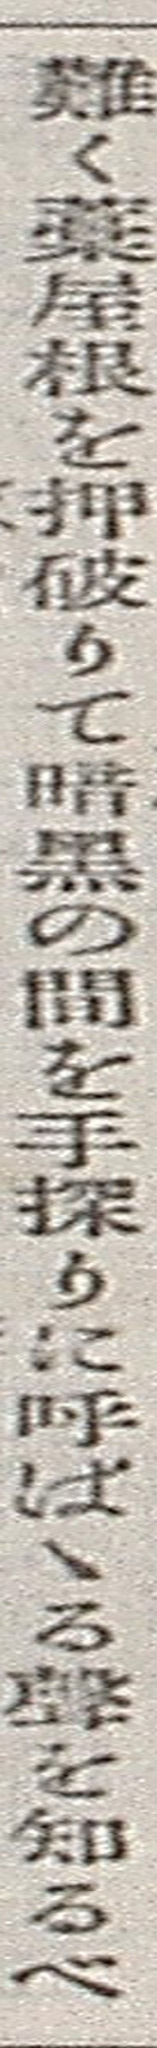難く藁屋根を押破りて暗黒の間を手探りに呼ばゝる声を知るべ
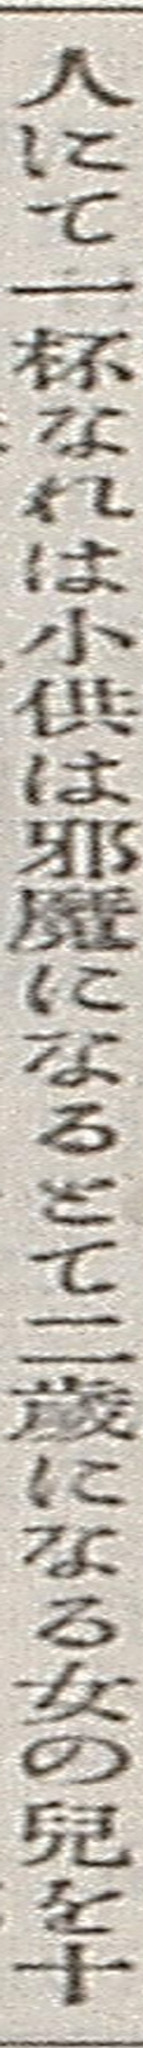人にて一杯なれは小供は邪魔になるとて二歳になる女の兒を十
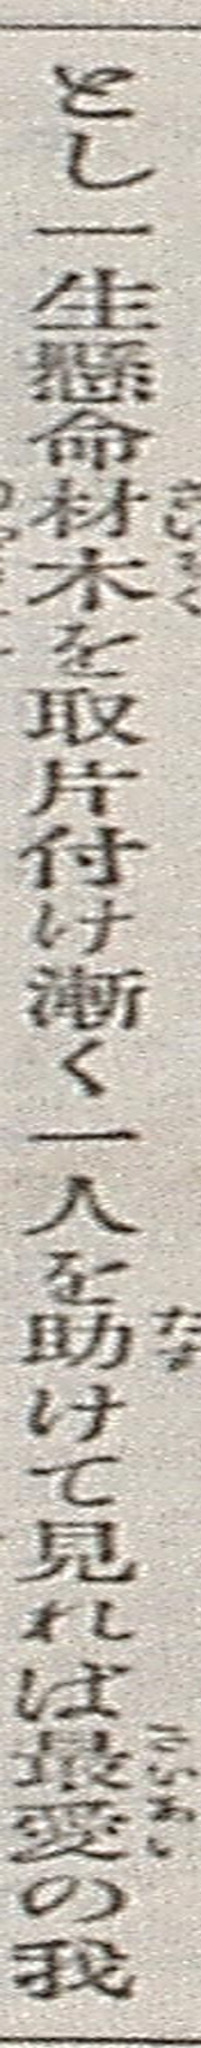とし一生懸命材木を取片付け漸く一人を助けて見れば最愛の我
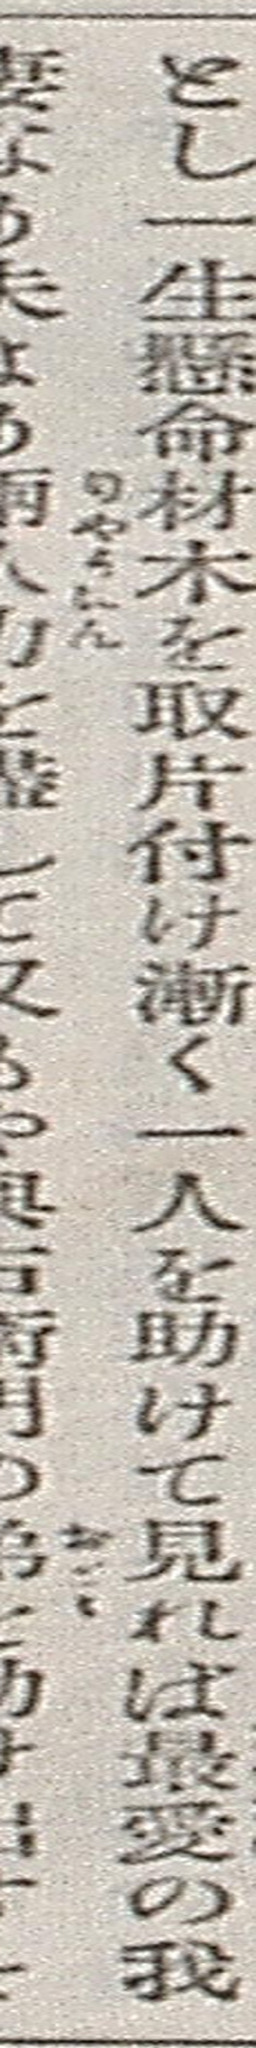妻なり夫より両人力を尽して又もや與右衛門の弟を助け出すそ
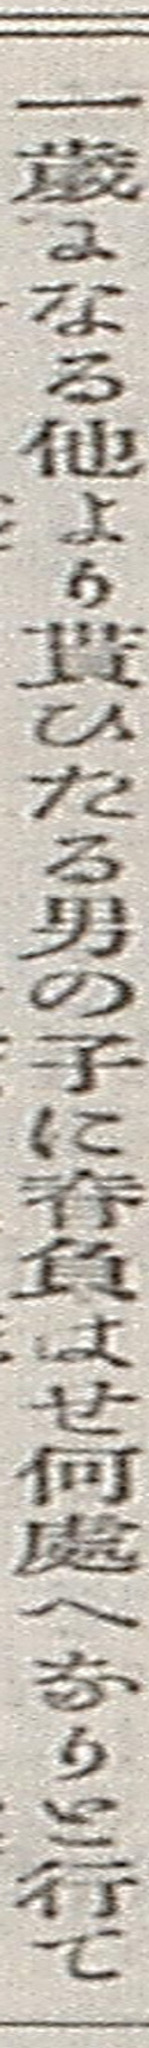一歳になる他より貰ひたる男の子に背負はせ何処へなりと行て
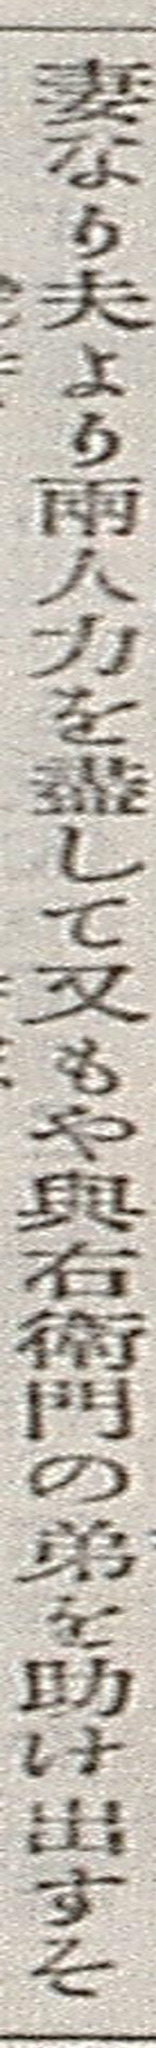妻なり夫より両人力を尽して又もや與右衛門の弟を助け出すそ
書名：風俗畫報臨時増刊第百二十號　大海嘯被害録（下）
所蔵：東京大学地震研究所図書室 Earthquake Research Institute Library, The University of Tokyo, JAPAN
